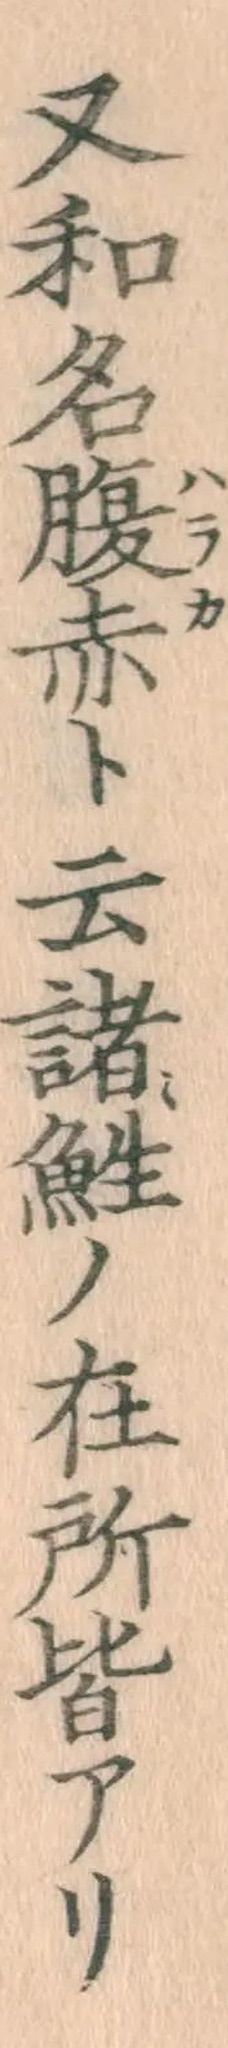又和名腹赤ト云諸鮏ノ在所皆アリ
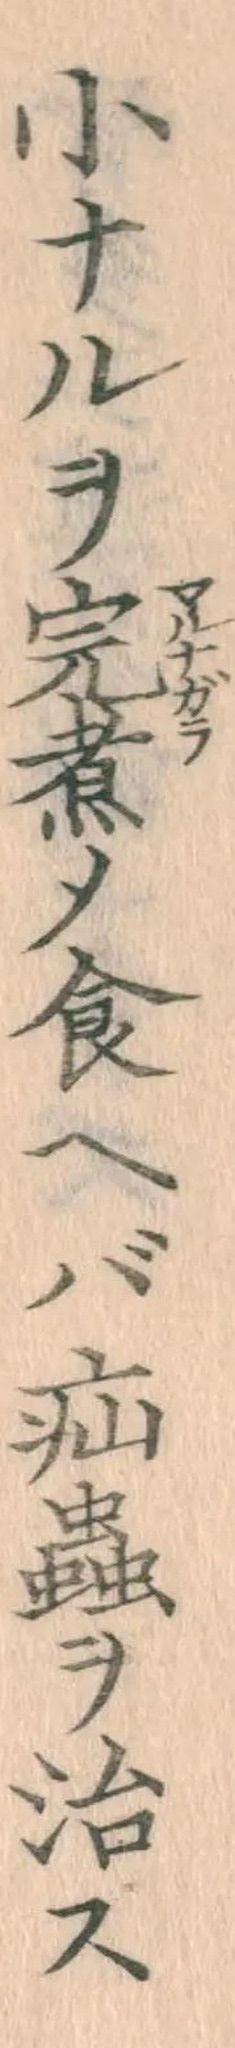小ナルヲ完煮シテ食ヘバ疝虫ヲ治ス
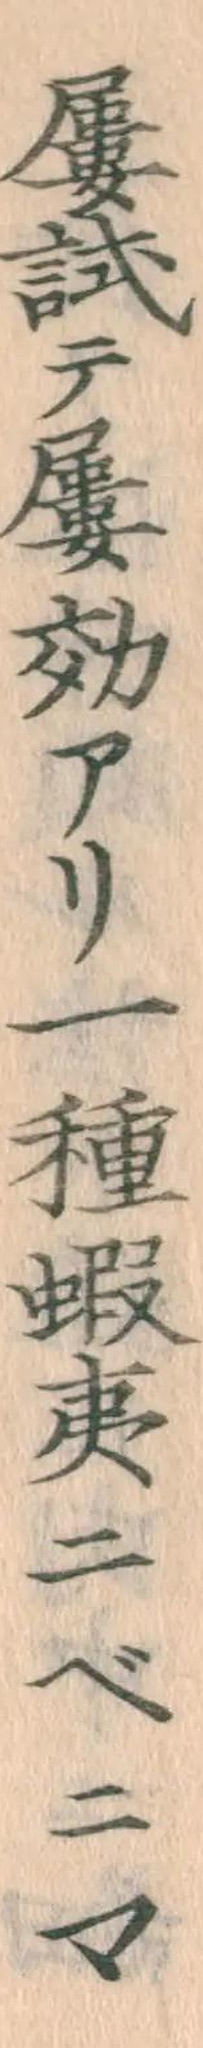屢試テ屢効アリ一種蝦夷ニベニマ
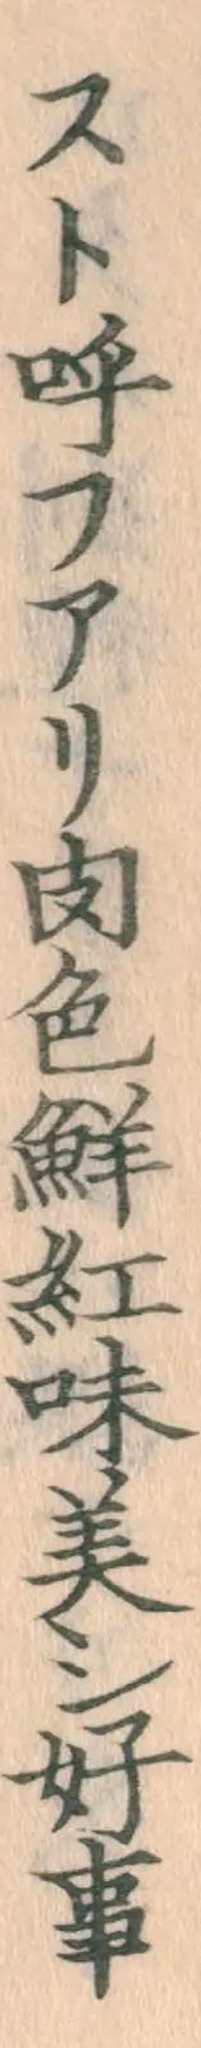スト呼フアリ肉色鮮紅味美シ好事
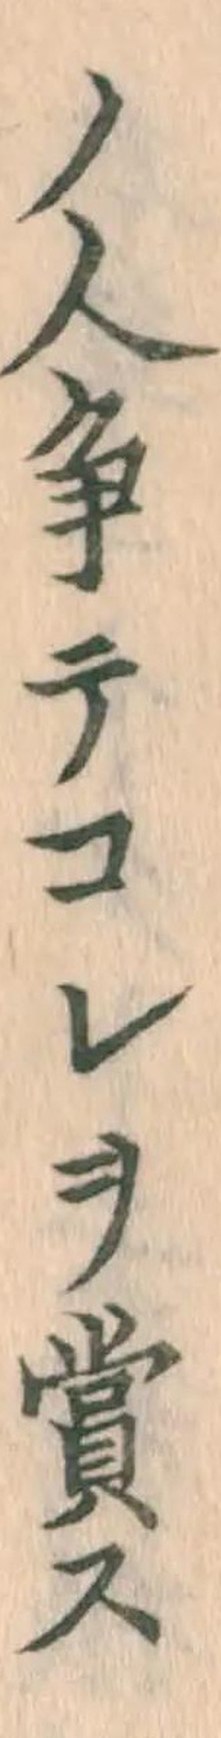ノ人争テコレヲ賞ス

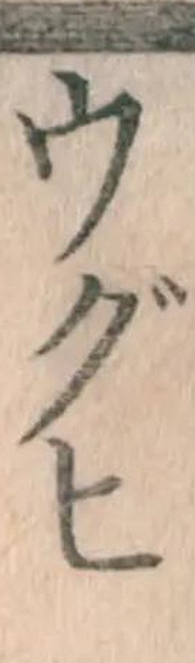ウグヒ
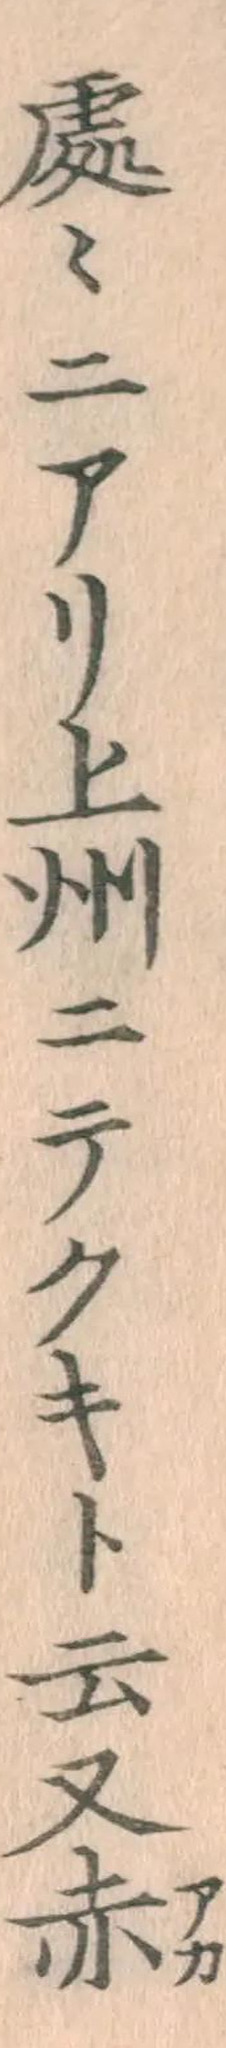処々ニアリ上州ニテクキト云又赤
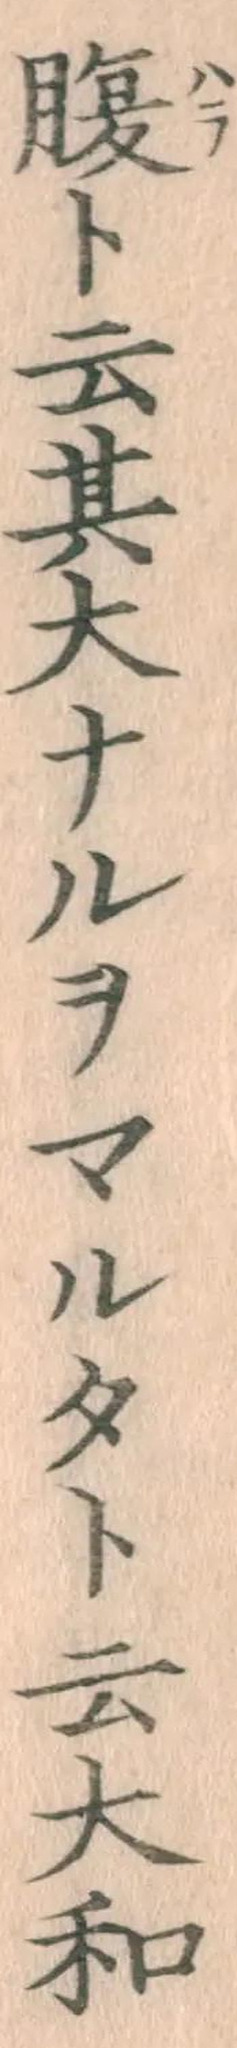腹ト云其大ナルヲマルタト云大和
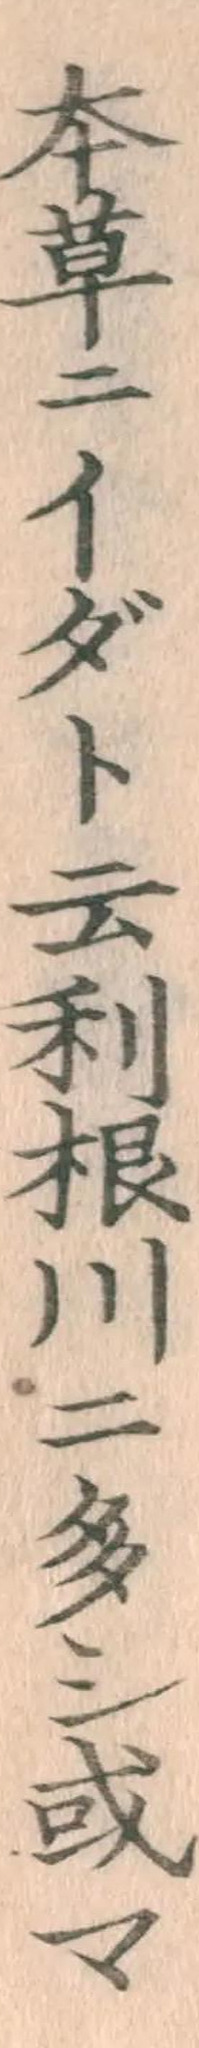本草ニイダト云利根川ニ多シ或マ
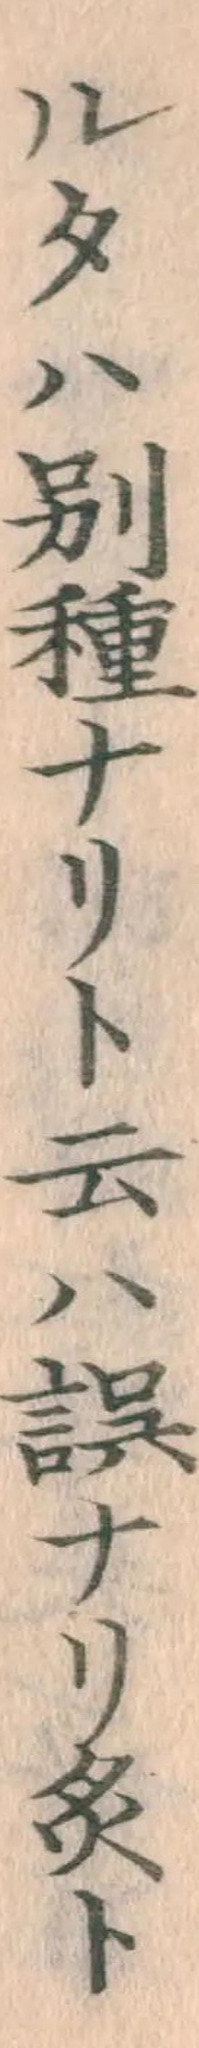ルタハ別種ナリト云ハ誤ナリ炙ト
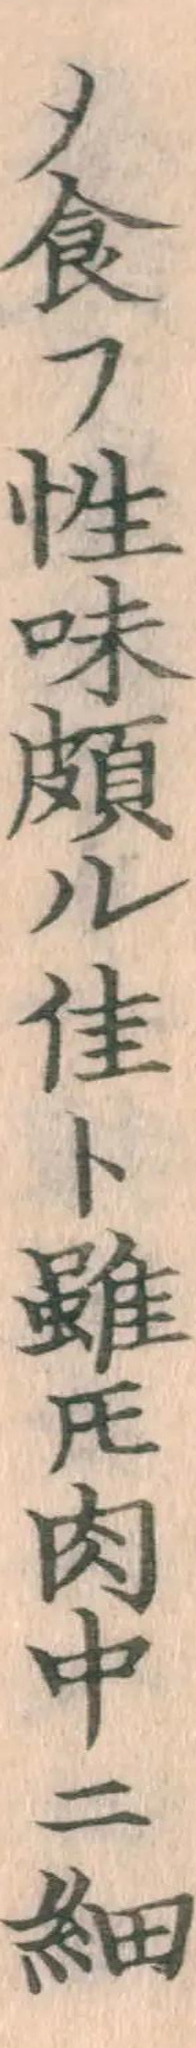シテ食フ性味頗ル佳ト雖トモ肉中ニ細
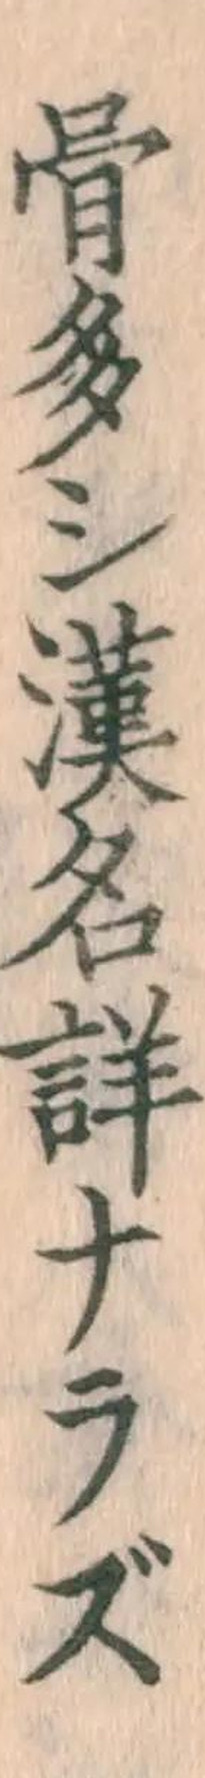骨多シ漢名詳ナラズ
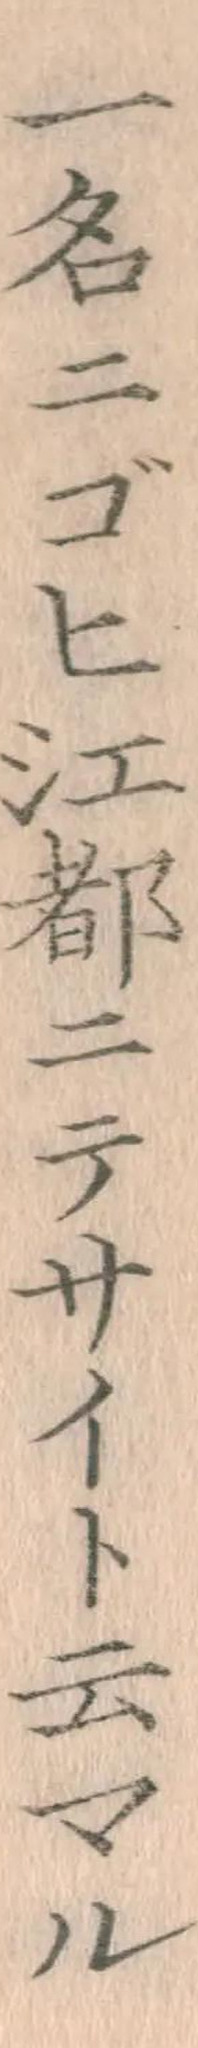一名ニゴヒ江都ニテサイト云マル
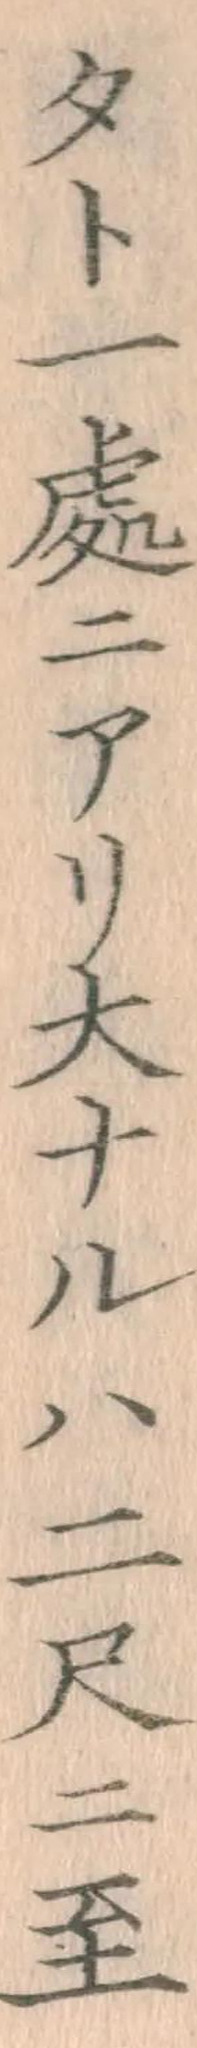タト一処ニアリ大ナルハ二尺ニ至
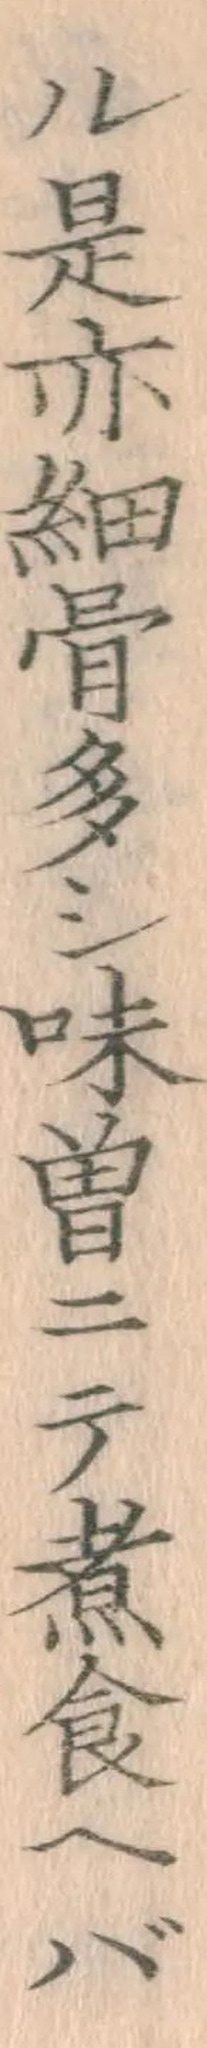ル是亦細骨多シ味噌ニテ煮食ヘバ
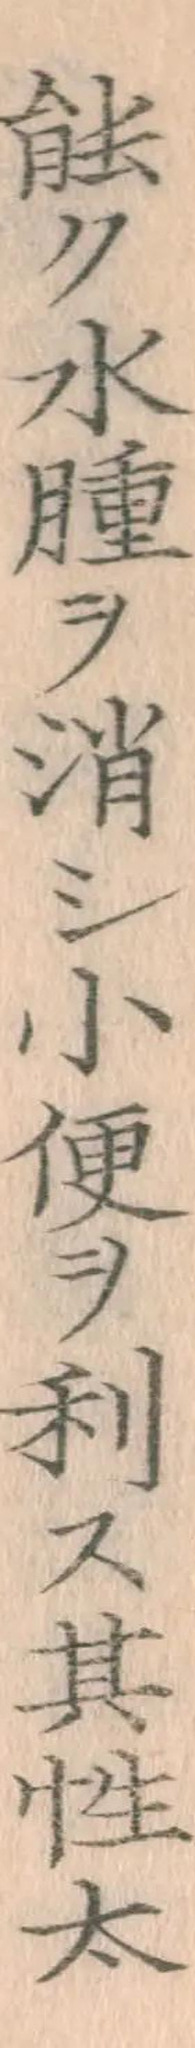能ク水腫ヲ消シ小便ヲ利ス其性太
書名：皇和魚譜 2巻
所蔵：国立国会図書館 National Diet Library, JAPAN
